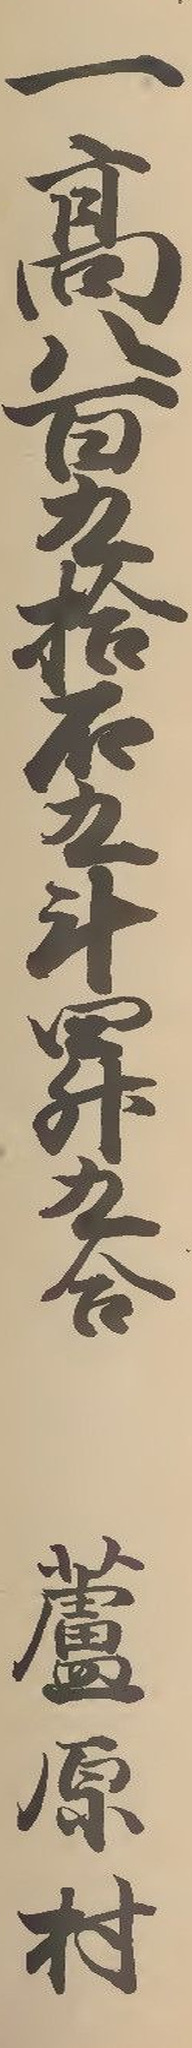一髙八百九拾石九斗四升九合蘆原村
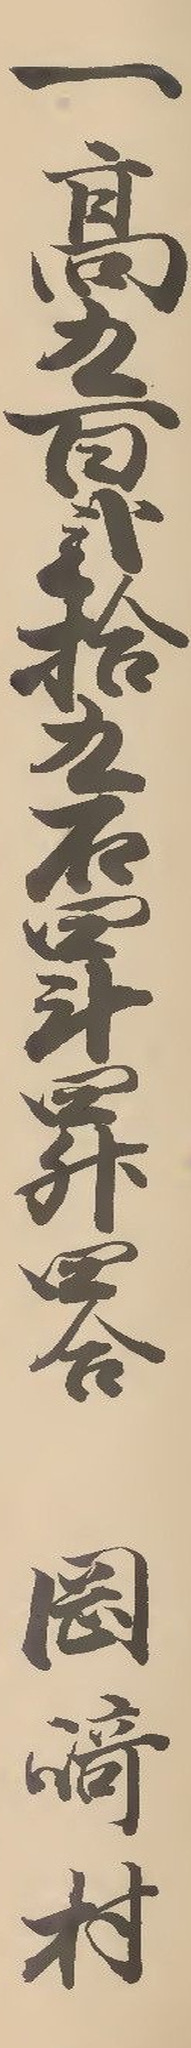一髙九百弐拾九石四斗四升四合岡崎村
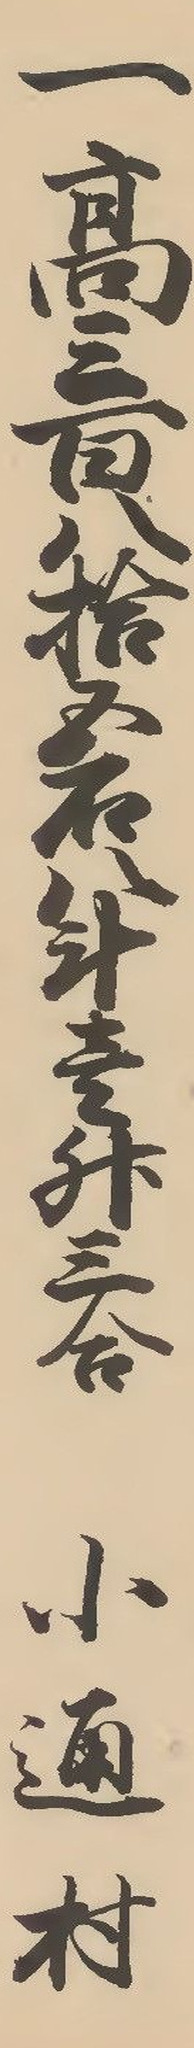一髙三百八拾五石八斗壱升三合小通村
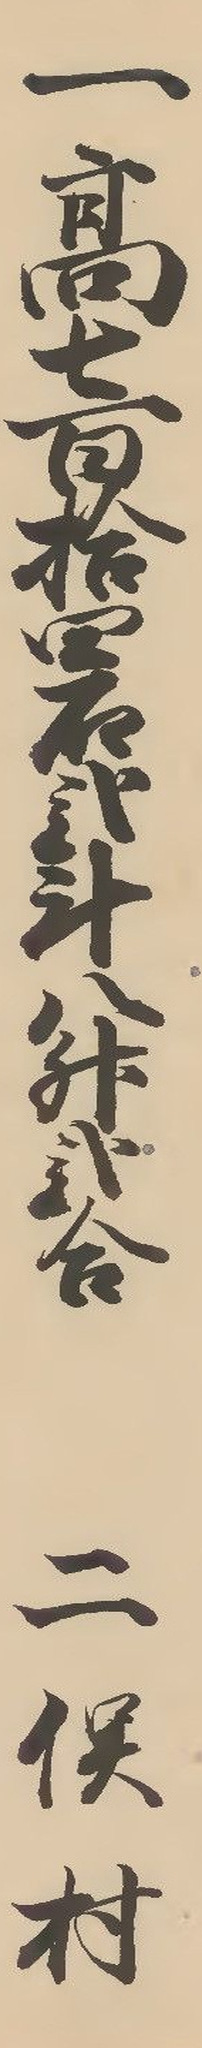一髙七百拾四石弐斗八升弐合二俣村
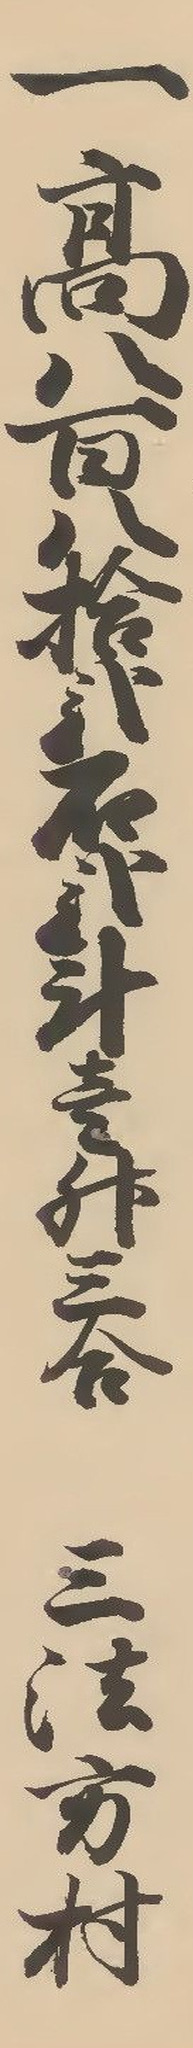一髙八百八拾弐石弐斗壱升三合三法方村

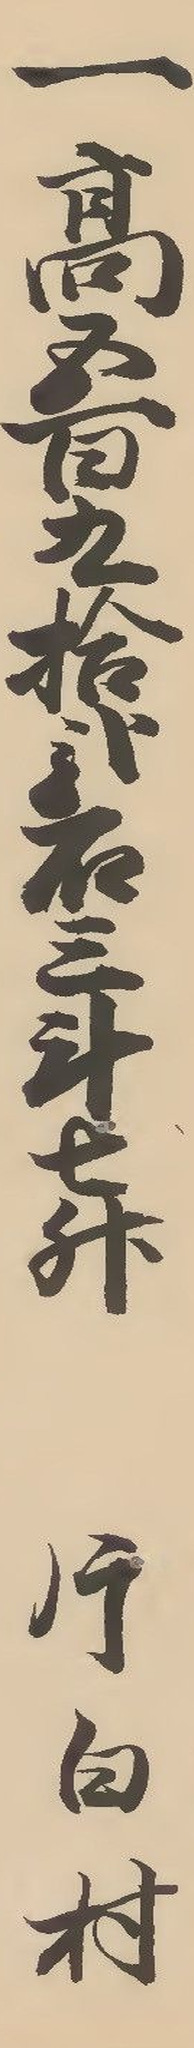一髙五百九拾弐石三斗七升片白村
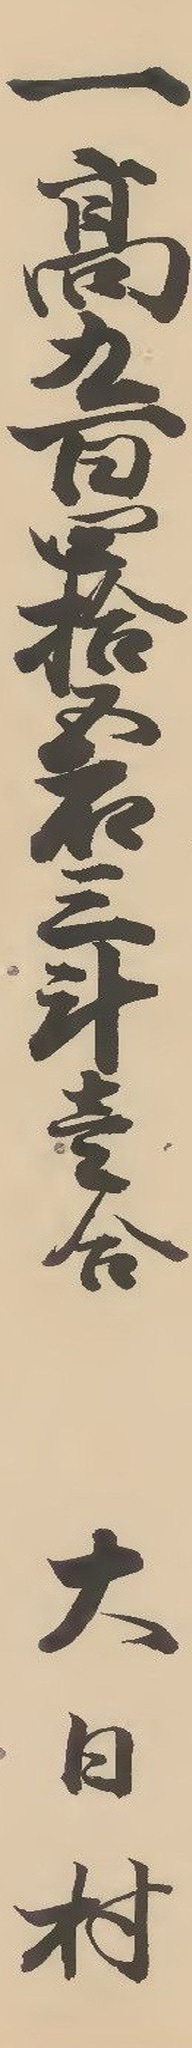一髙九百四拾五石三斗壱合大日村
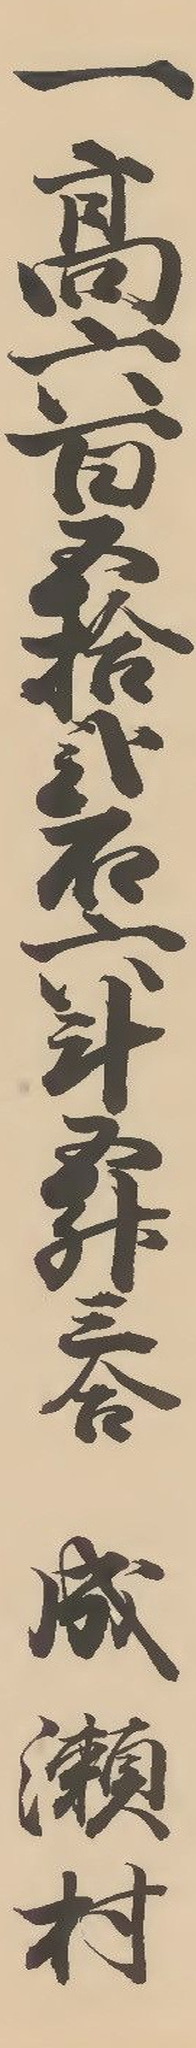一髙六百五拾弐石六斗五升三合成瀬村
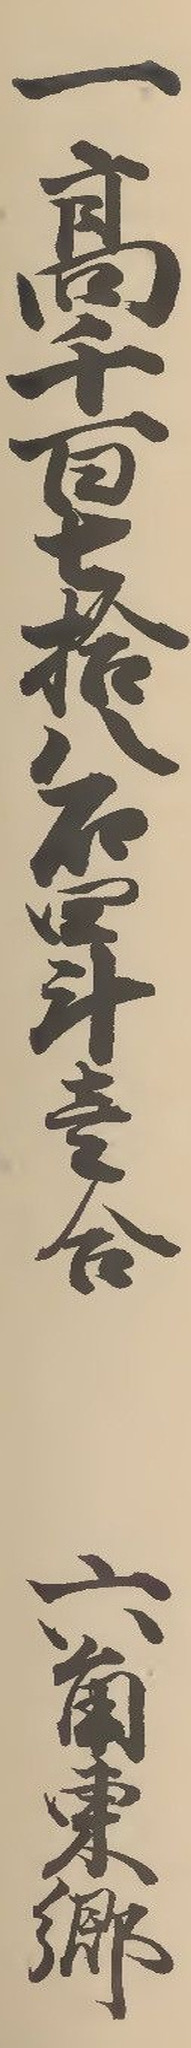一髙千百七拾八石四斗壱合六角東郷
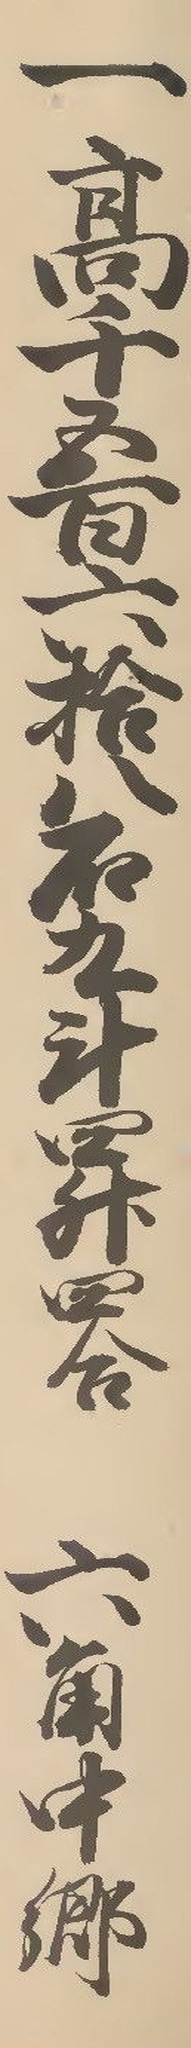一髙千五百六拾八石九斗四升四合六角中郷
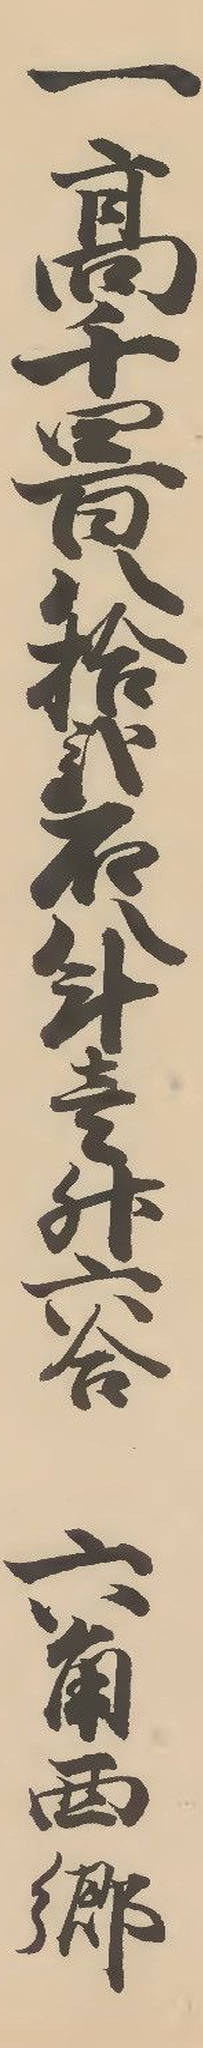一髙千四百八拾弐石八斗壱升六合六角西郷
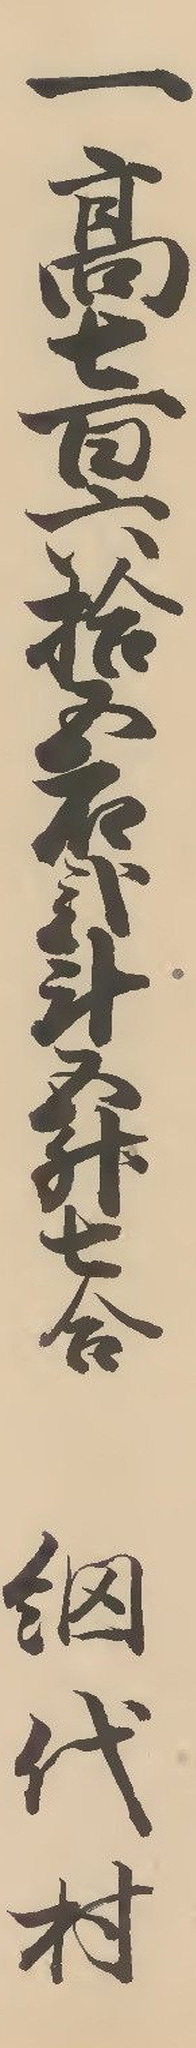一髙七百六拾五石弐斗五升七合網代村
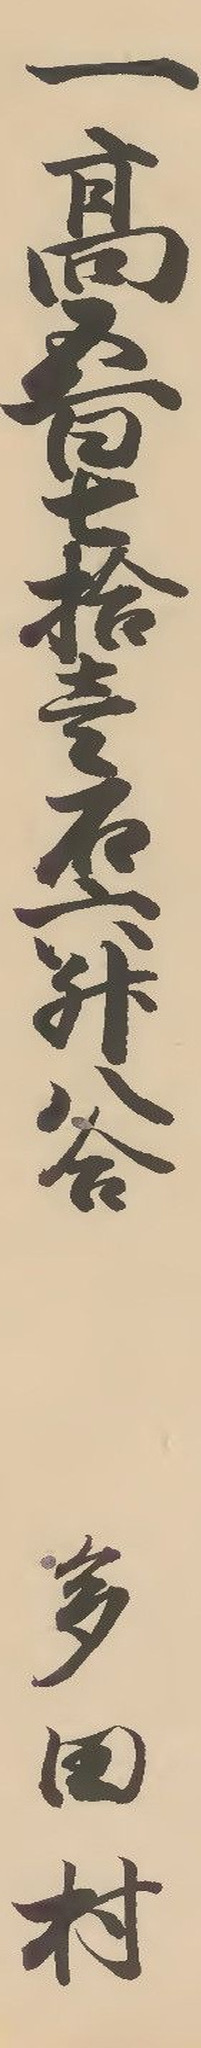一髙五百七拾壱石六升八合多田村

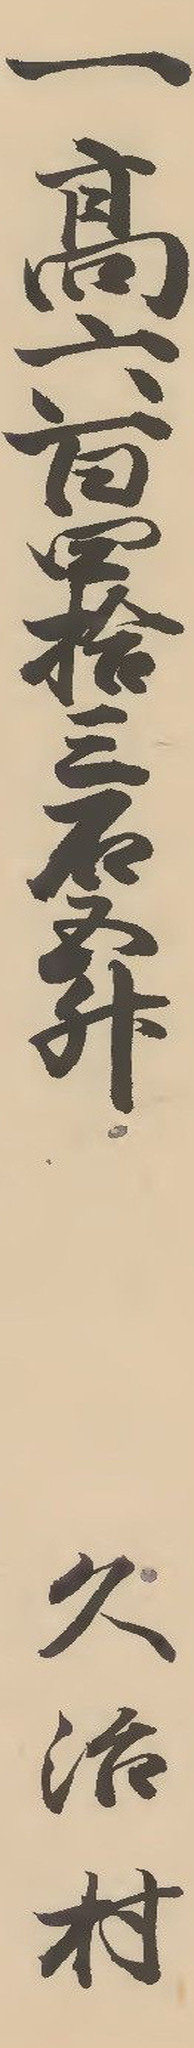一髙六百四拾三石五升久治村
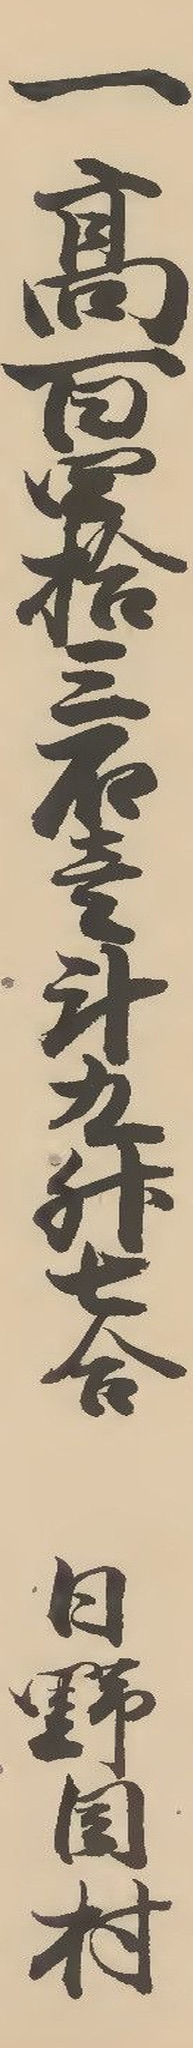一髙百四拾三石壱斗九升七合日野目村
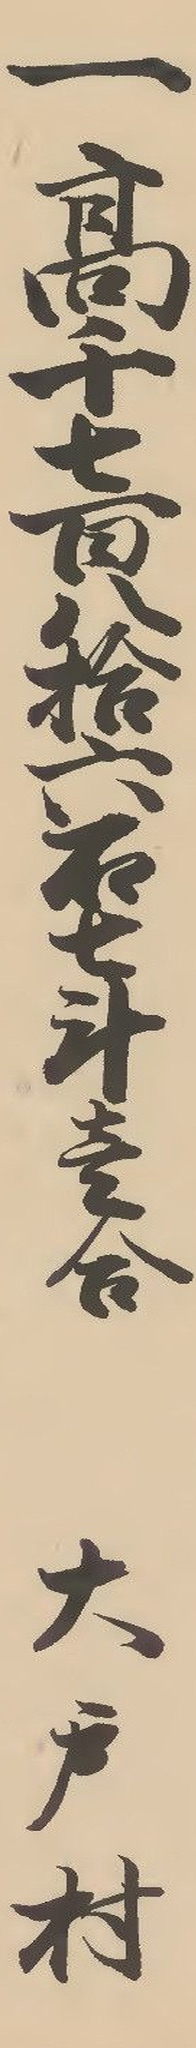一髙千七百八拾六石七斗壱合大戸村
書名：肥前国郷帳
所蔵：国立公文書館 National Archives of Japan
